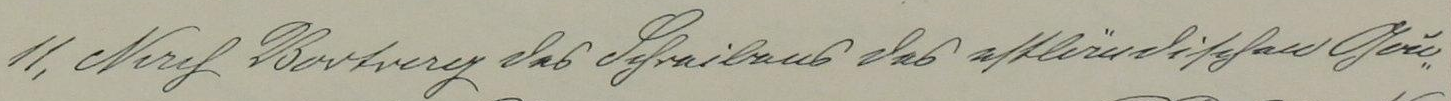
11. Nach Vortrag des Schreibens des estländischen Gou-
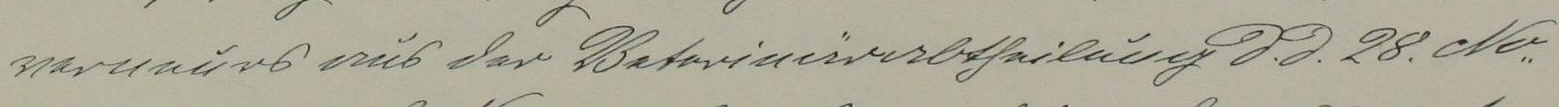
verneurs aus der Veterinärabtheilung d.d. 28. No-
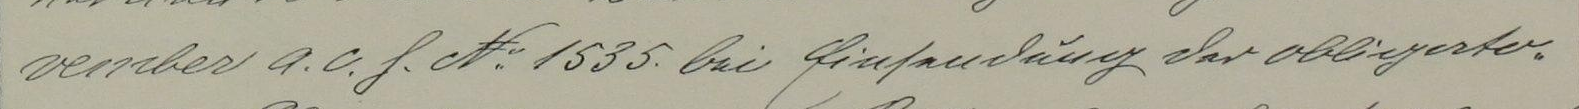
vember a.c. s. No. 1535. bei Einsendung der obligato-
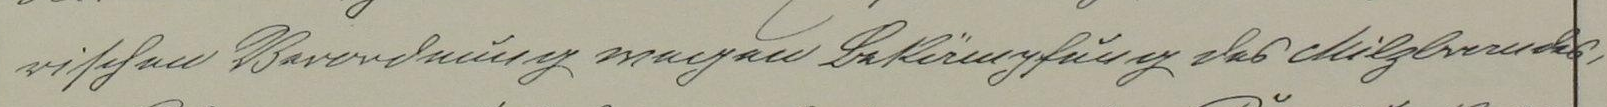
rischen Verordnung wegen Bekämpfung des Milzbrandes,
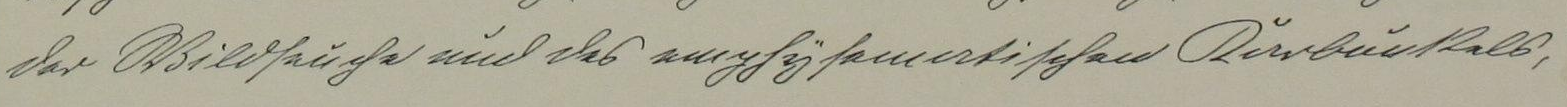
der Wildseuche und des emphysematischen Karbunkels,
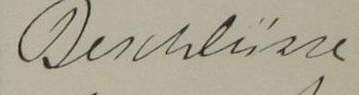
Beschlüsse
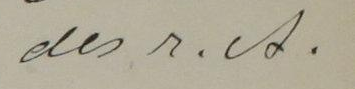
des r.A.
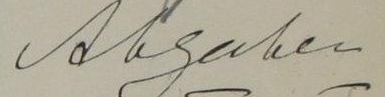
Abgaben
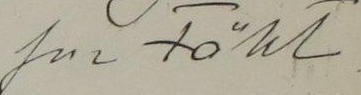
für Fäht
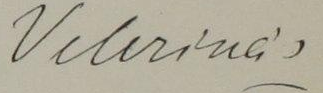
Veterinär
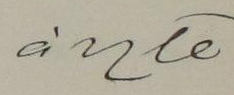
ärzte
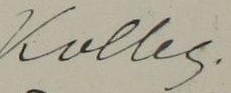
Kolleg.
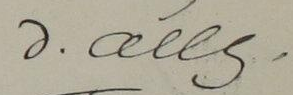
d. allg
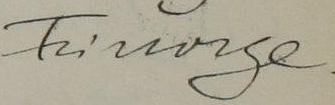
Fürsorge
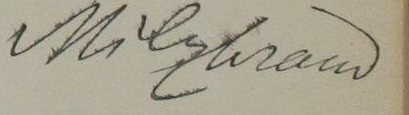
Milzbrand
